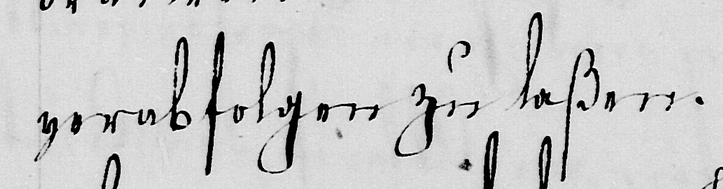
verabfolgen zu laßen.
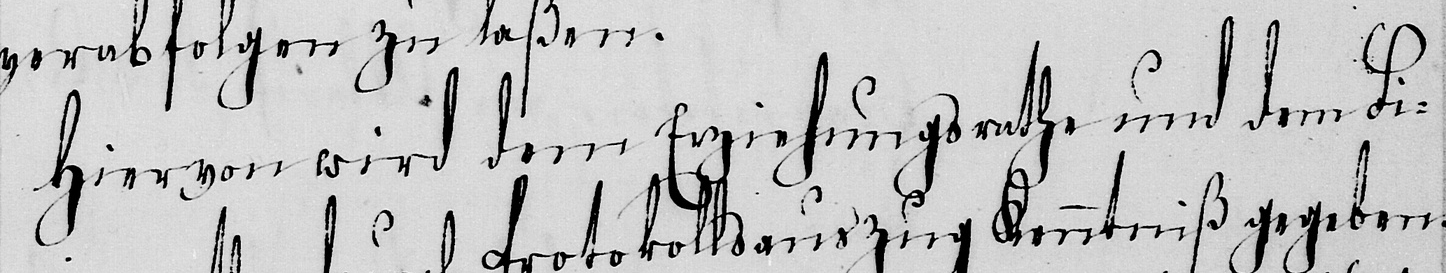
Hiervon wird dem Erziehungsrathe und dem Fi¬
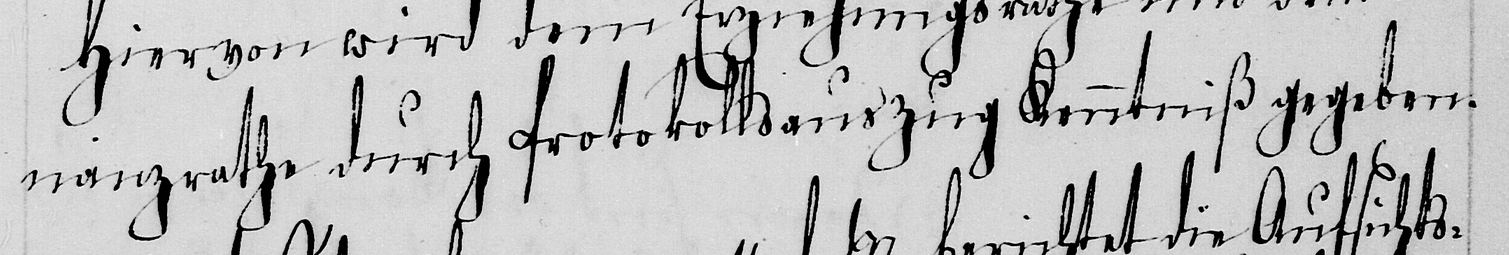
nanzrathe durch Protokollsauszug Kenntniß gegeben.
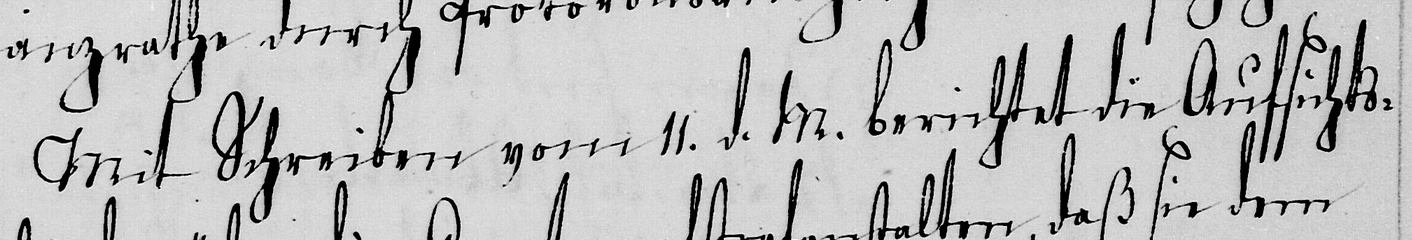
Mit Schreiben vom 11. d. M. berichtet die Aufsichts¬
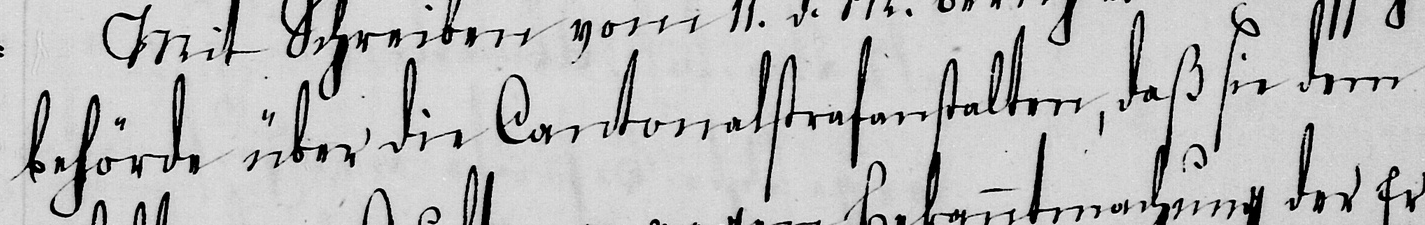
behörde über die Cantonalstrafanstalten, daß sie dem
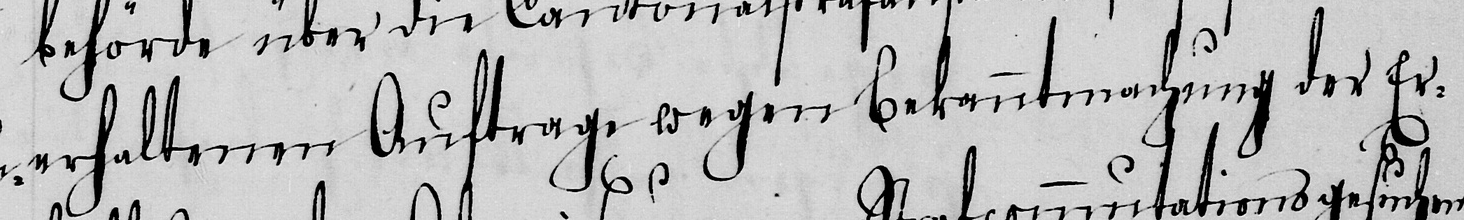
erhaltenen Auftrage wegen Bekanntmachung der Er¬
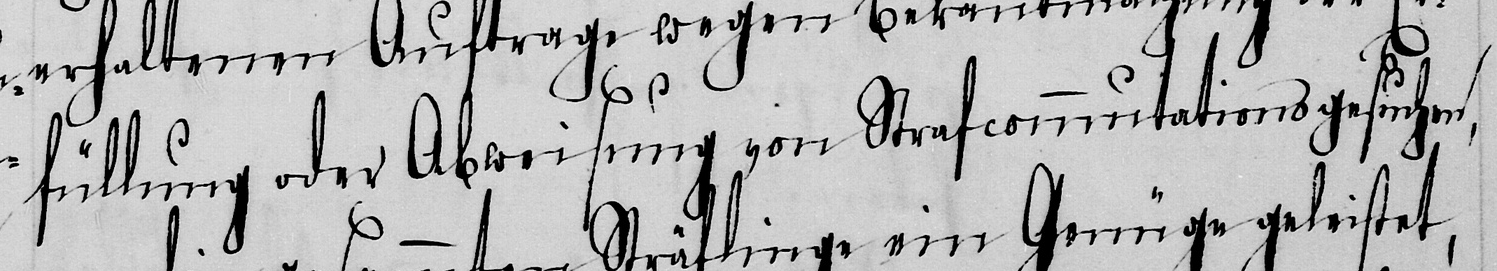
füllung oder Abweisung von Strafcommutationsgesuchen,
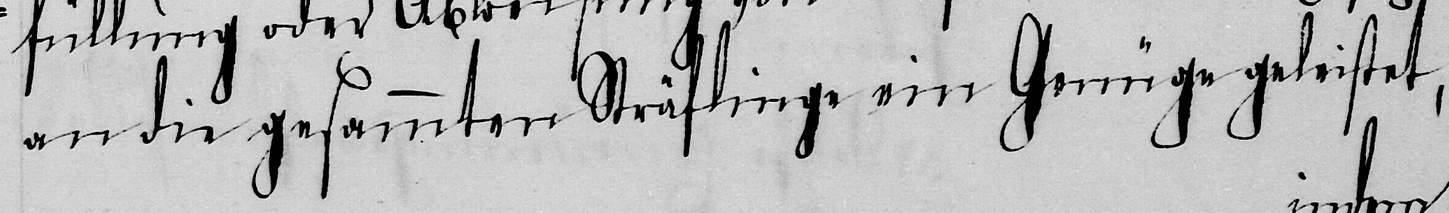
an die gesammten Sträflinge ein Genüge geleistet,
